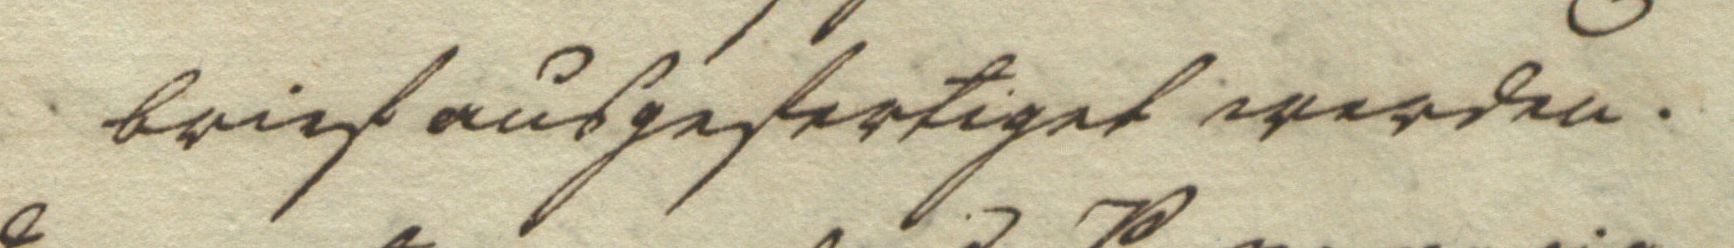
brief ausgefertiget werden.
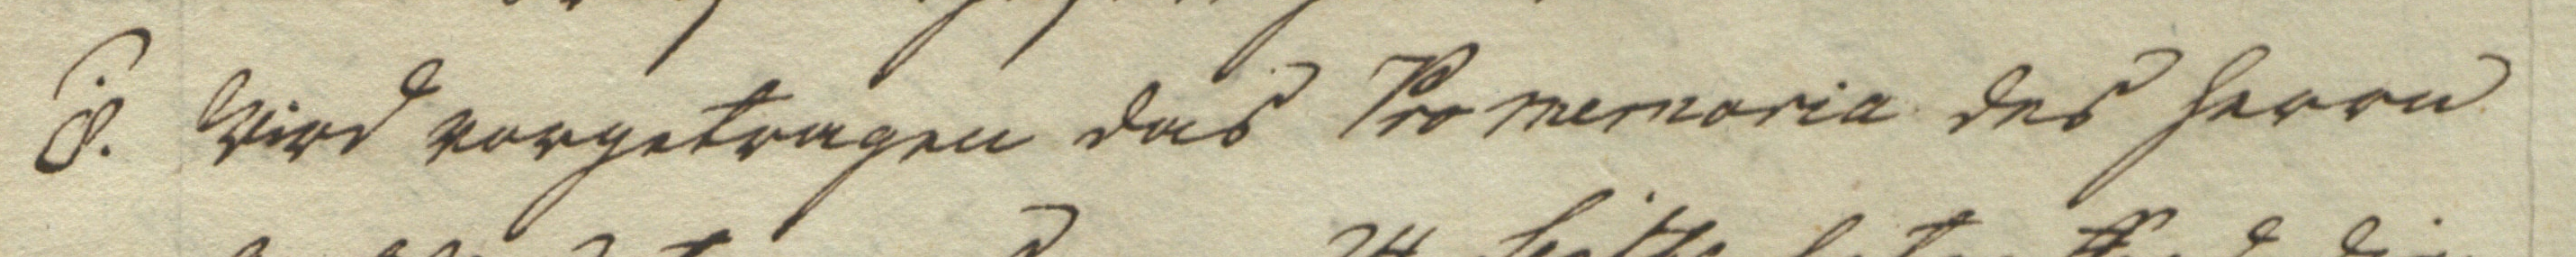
8. Wird vorgetragen das Promemoria des Herrn
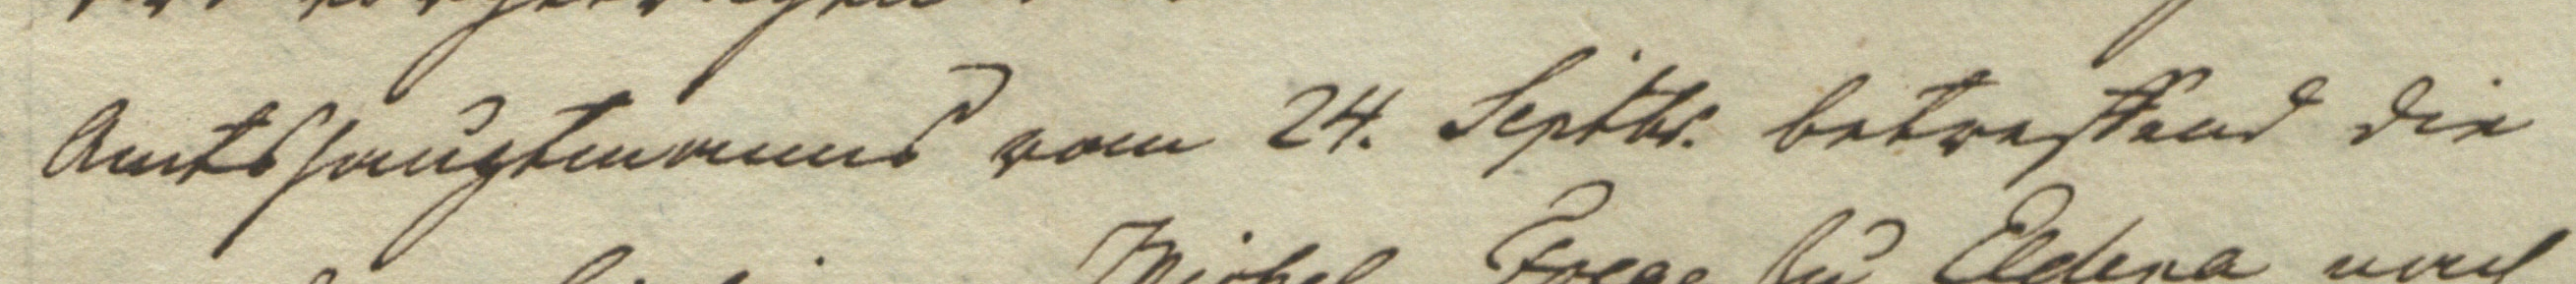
Amtshauptmanns vom 24. Septbr betreffend die
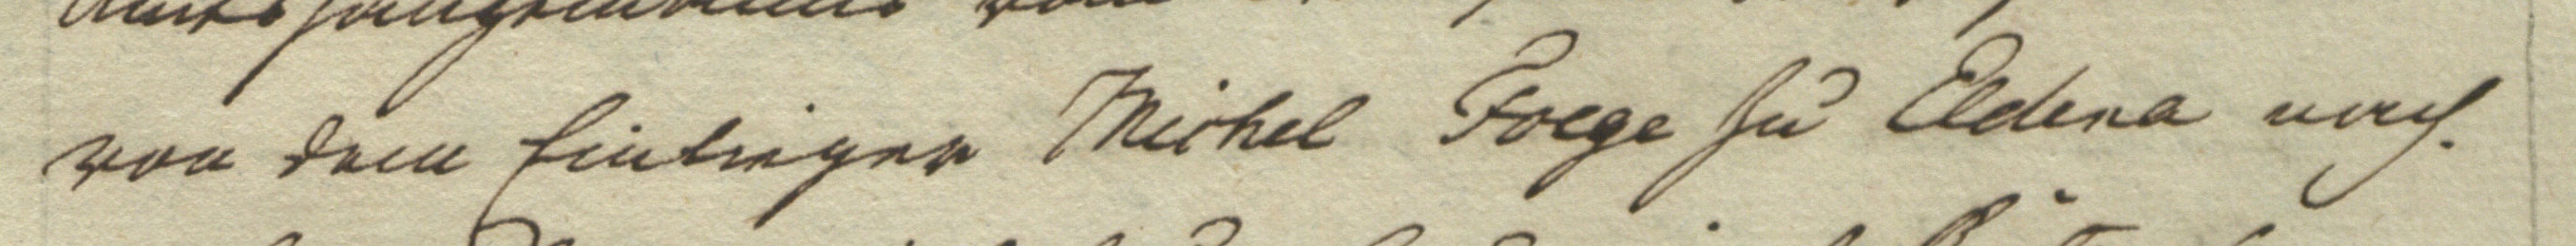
von dem Einlieger Michel Foege zu Eldena nach¬
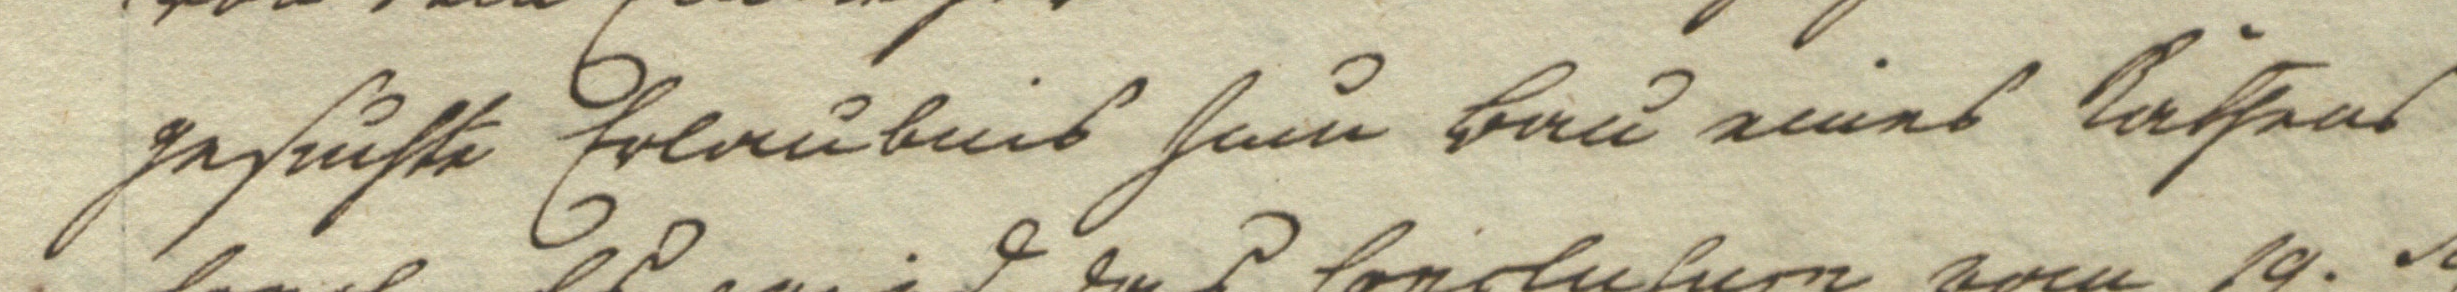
gesuchte Erlaubnis zum Bau eines Kathens
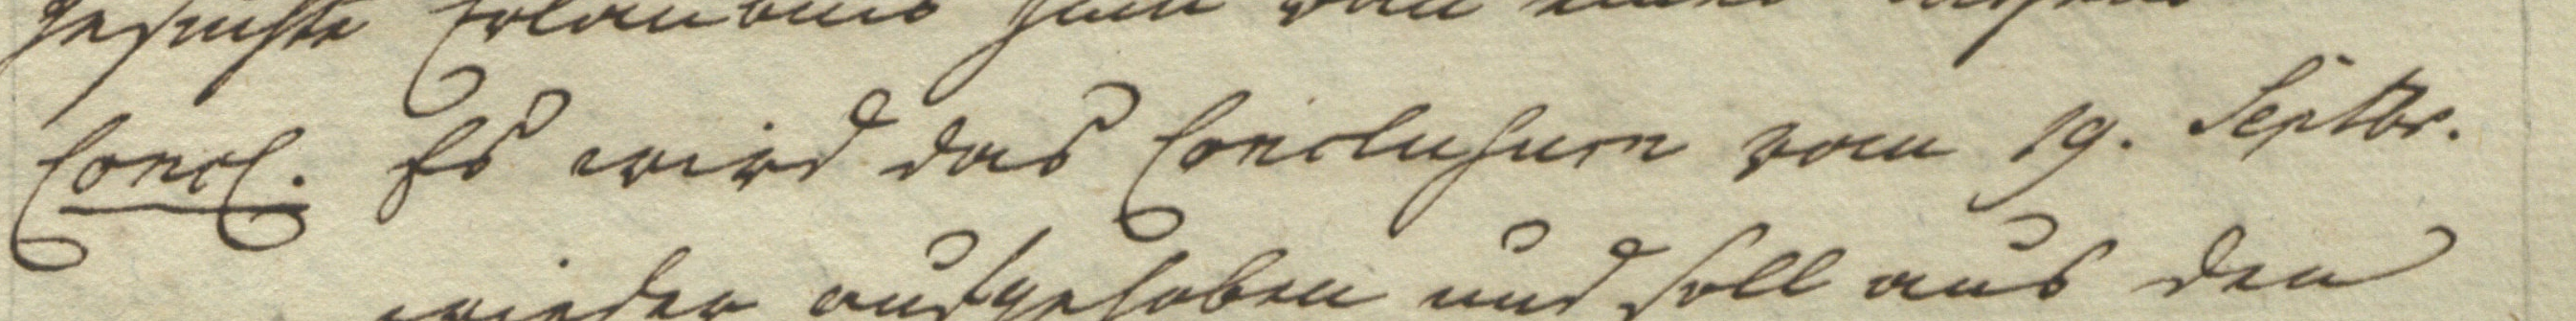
Concl. Es wird das Conclusum vom 19. Septbr.
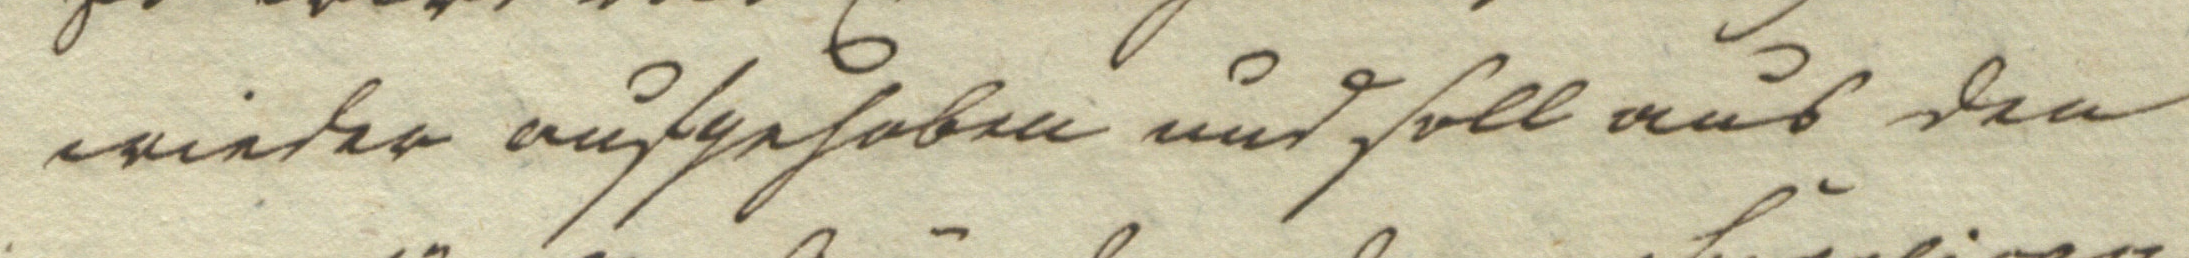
wieder aufgehoben und soll aus den
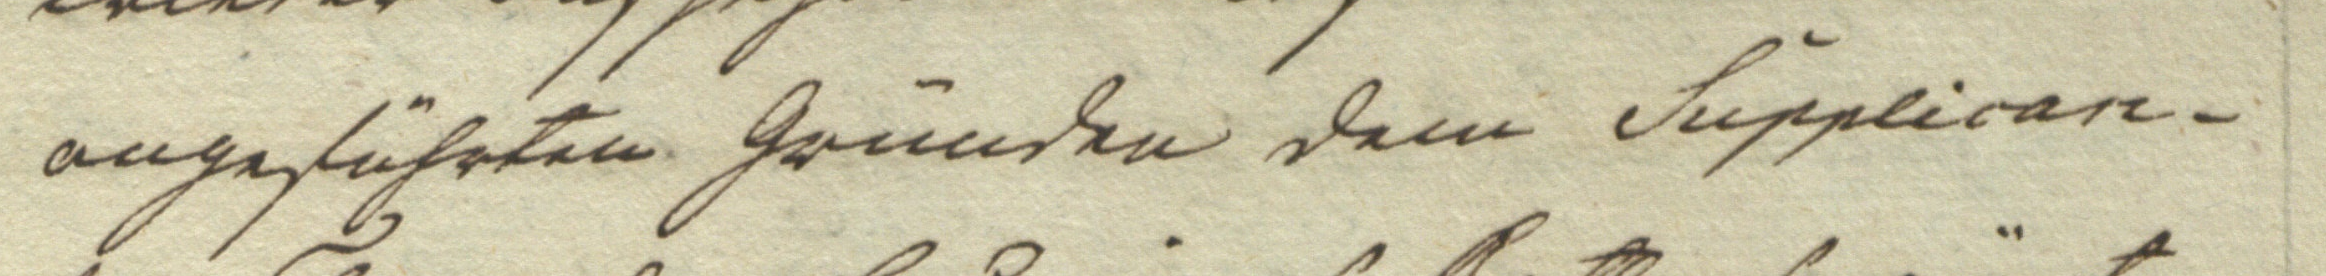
angeführten Gründen dem Supplican¬
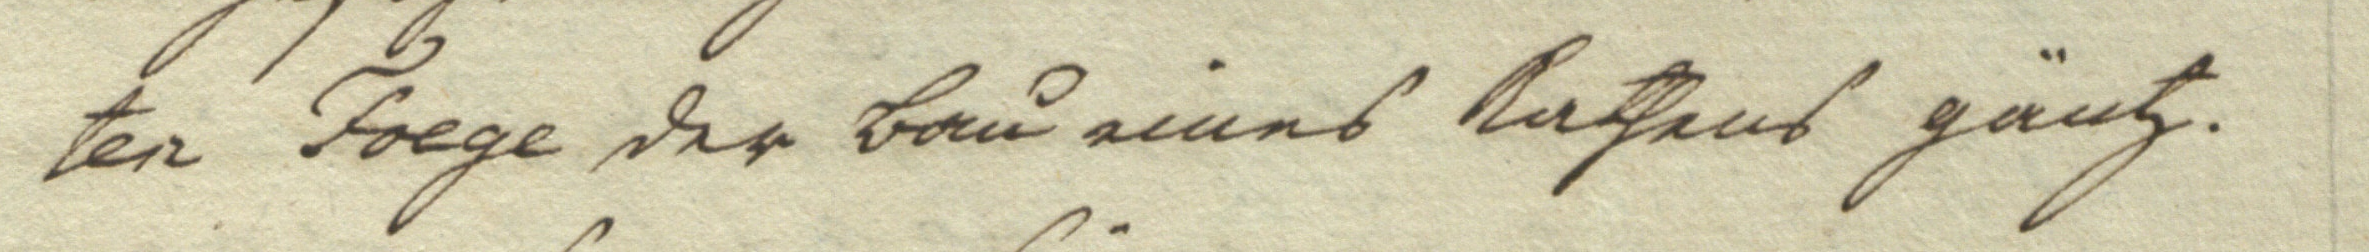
ten Foege der Bau eines Kathens gäntz¬
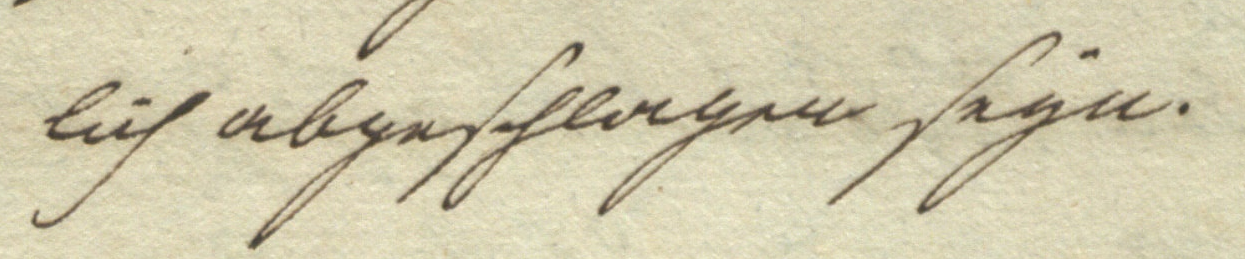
lich abgeschlagen seÿn.
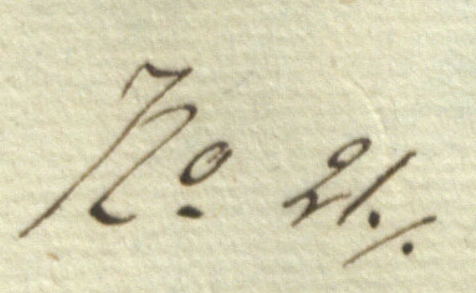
No 21.
